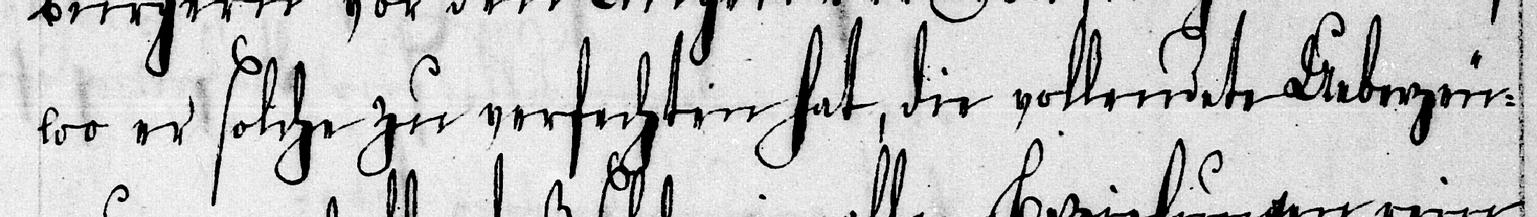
wo er solche zu verfechten hat, die vollendete Ueberzeu¬
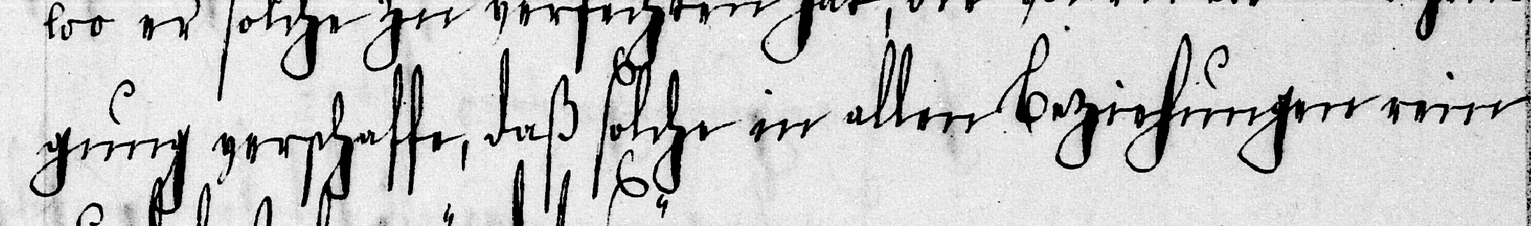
gung verschaffe, daß solche in allen Beziehungen rein
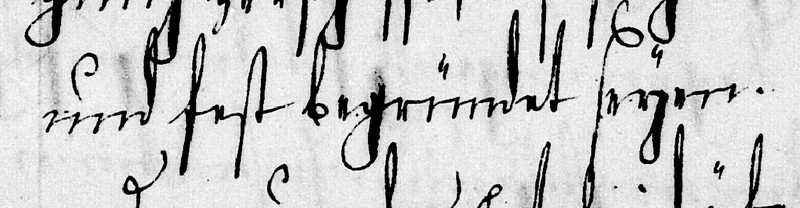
und fest begründet seyen.
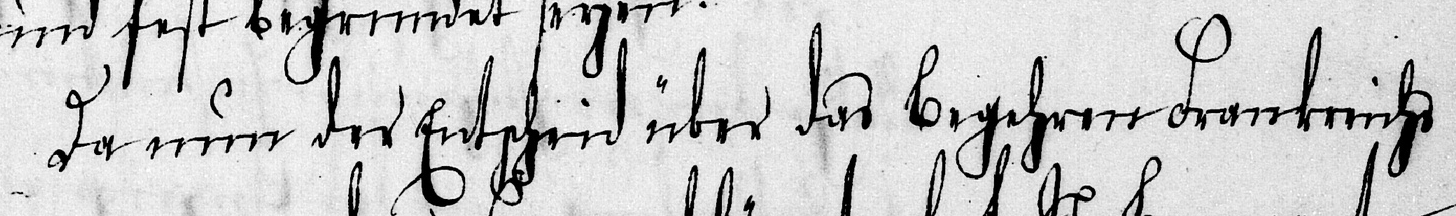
Da nun der Entscheid über das Begehren Frankreichs
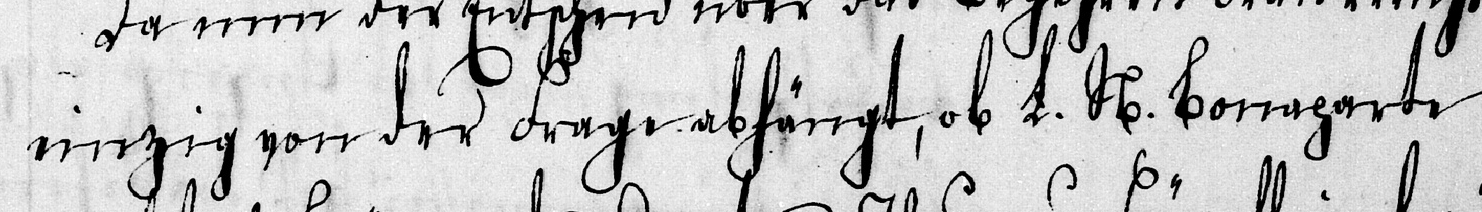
einzig von der Frage abhängt, ob L. N. Bonaparte
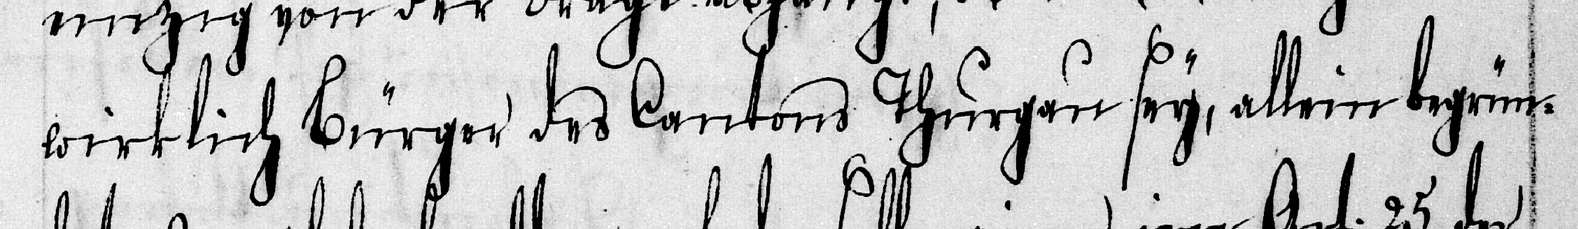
wirklich Bürger des Cantons Thurgau sey, allein begrün¬
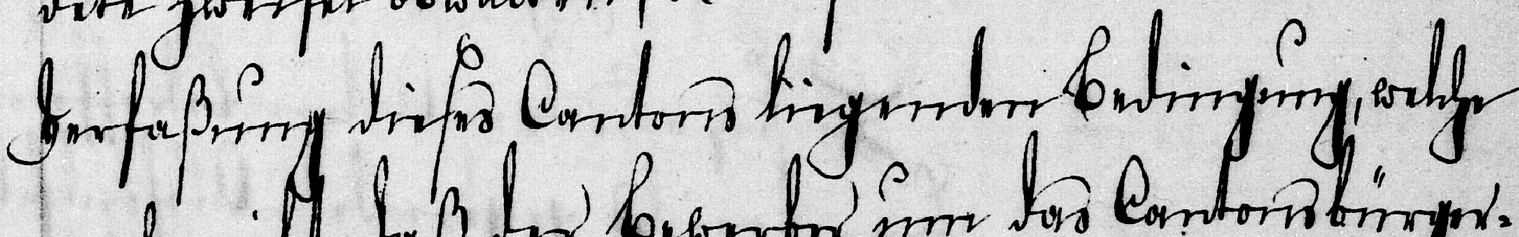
Verfaßung dieses Cantons liegenden Bedingung, welche
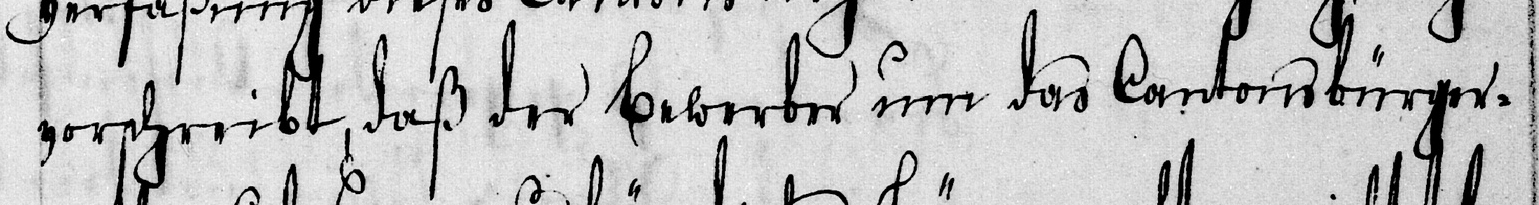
vorschreibt, daß der Bewerber um das Cantonsbürger¬
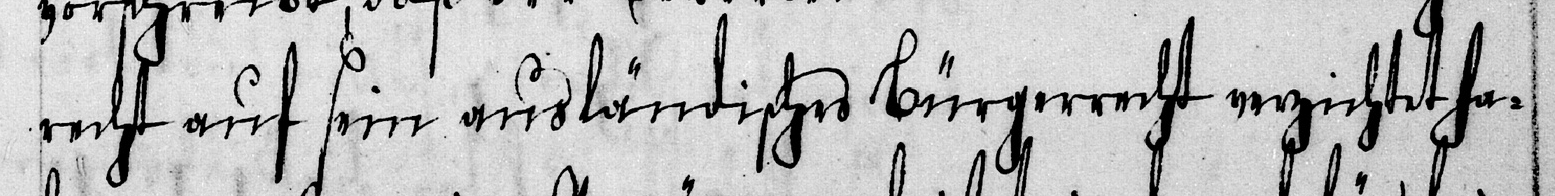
recht auf sein ausländisches Bürgerrecht verzichtet h¬
